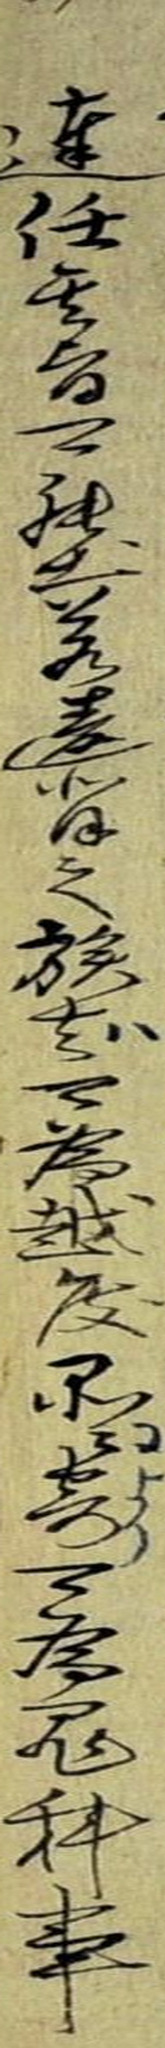達任其旨可罷出若違背之族者可為越度品ニ寄可為罪科事
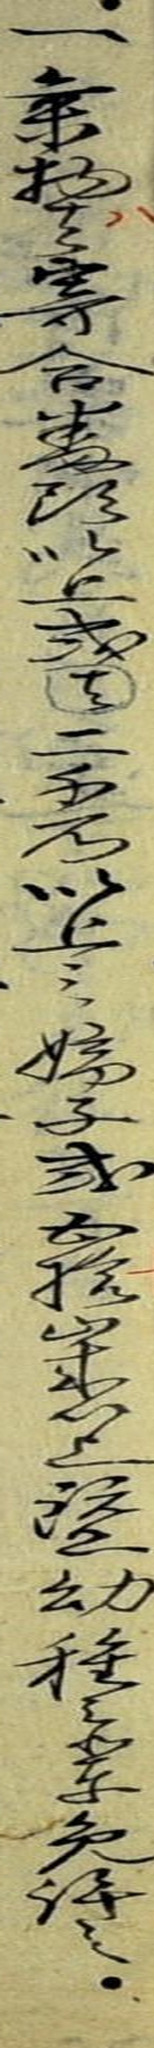一乗物者寄合番頭以上或者ニ千石以上之嫡子或五拾歳以上曁幼稚之輩免許之
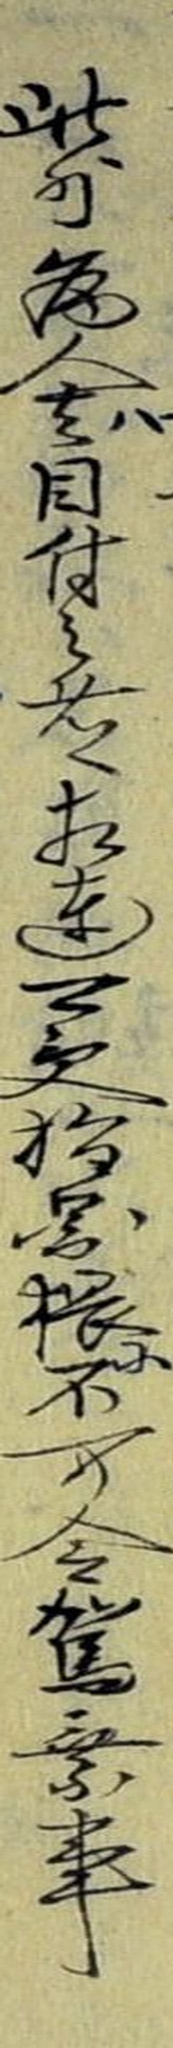此外病人者目付之者へ相達可受指図猥尓不可令駕乗事
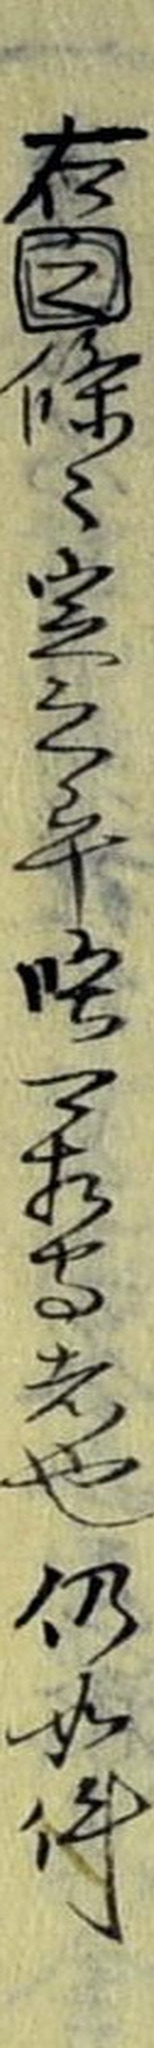右之条々定之畢堅可相守者也仍如件
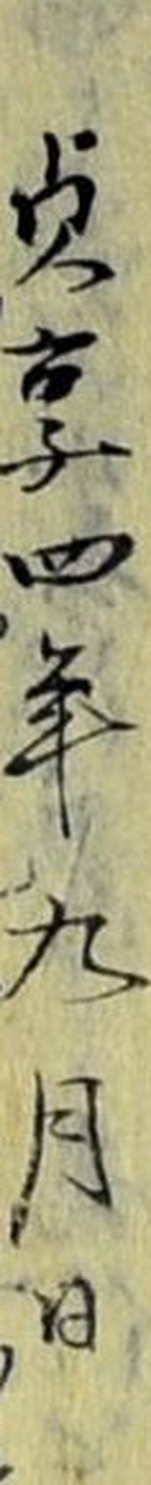貞享四年九月日
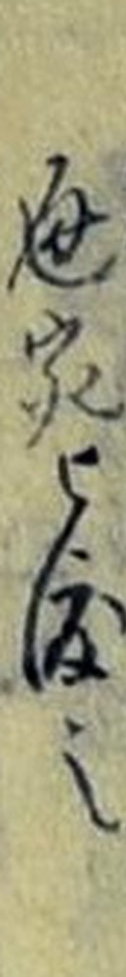通宛被渡之
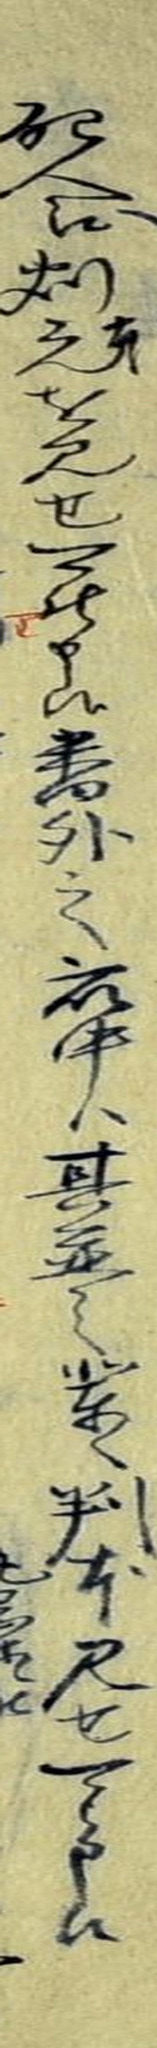配人江判元を見せ可被申候番外之衆中ハ其並之輩へ判本見せ可被申候
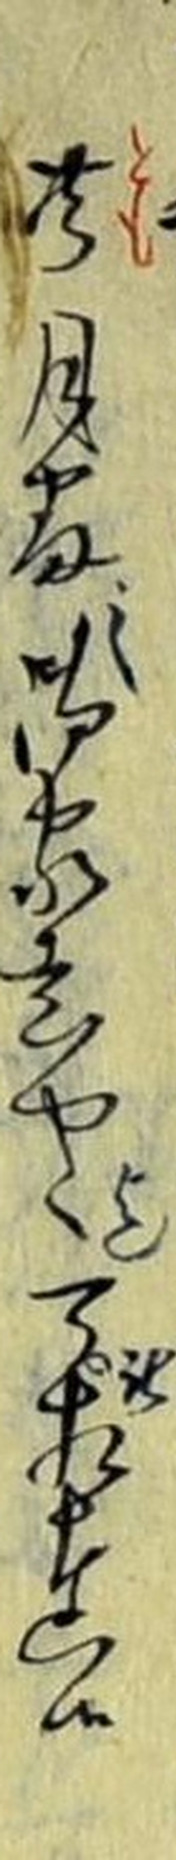共月番之御家老中へ可◦被相達候

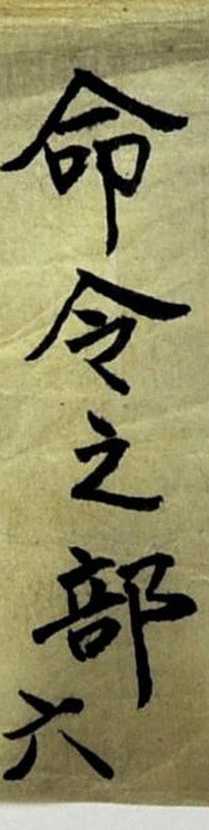命令之部六

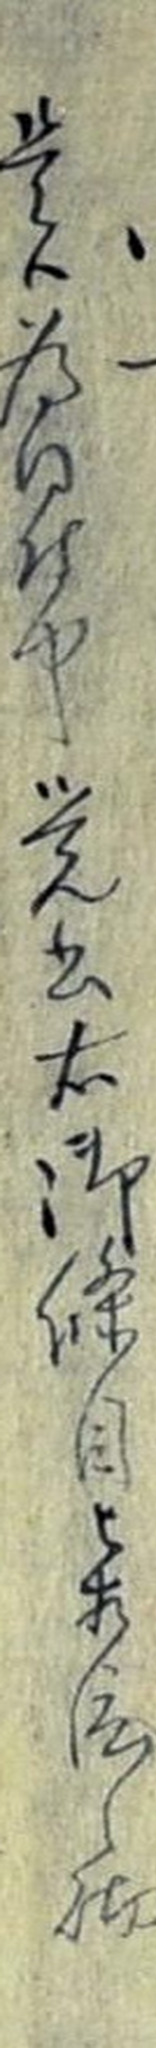是ハ為目付中覚書右御條目被相渡候砌
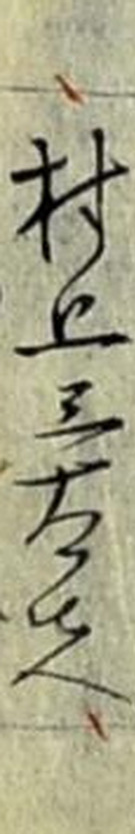村上三太夫
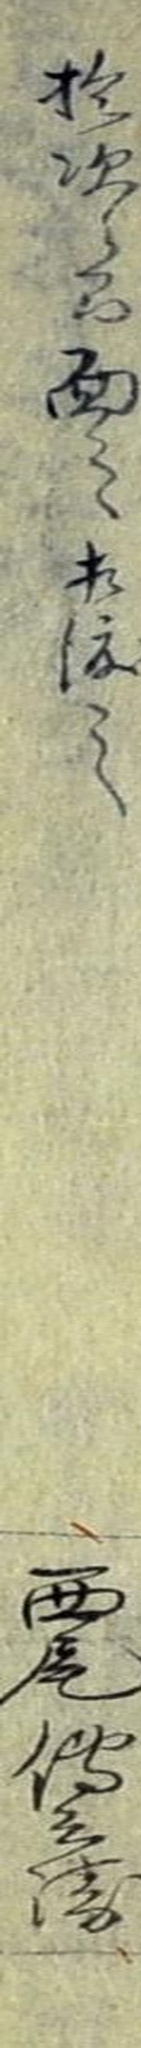於次之間面々へ相渡之丹羽八左衛門
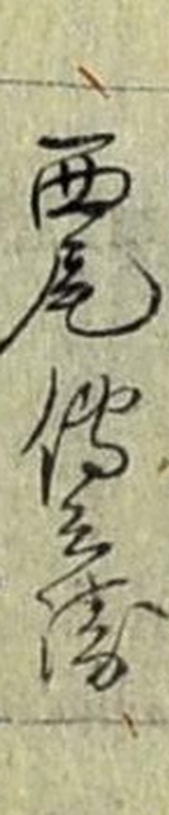西尾伝兵衛
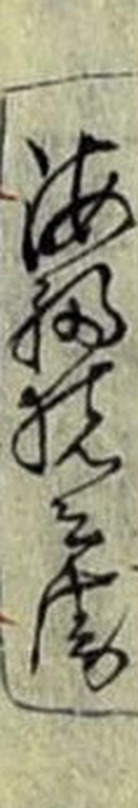海福猪兵衛
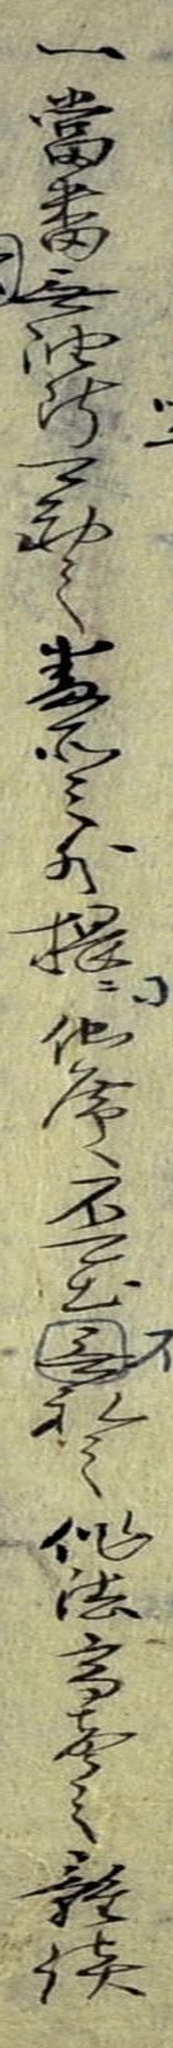一当番無油断可勤之番所之外猥ニ他席へ不可出無不礼之作法高声之雑談
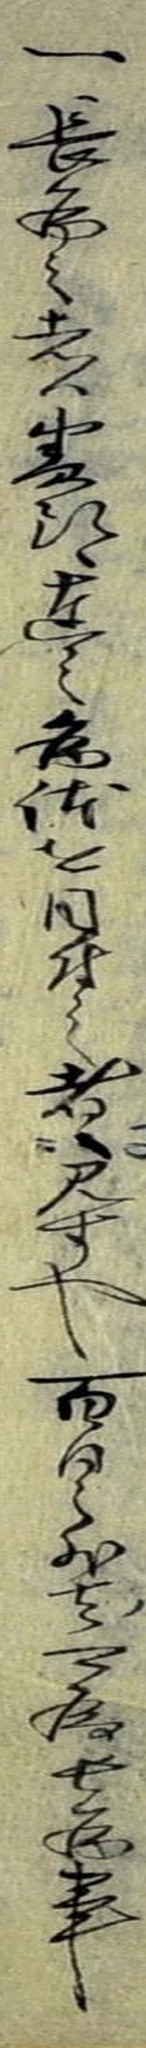一長病之者ハ番頭へ達之病体を目付之者ニ見すへし百日之外者可為長病事
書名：命令之部 一
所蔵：福井県文書館 Fukui Prefectural Archives
